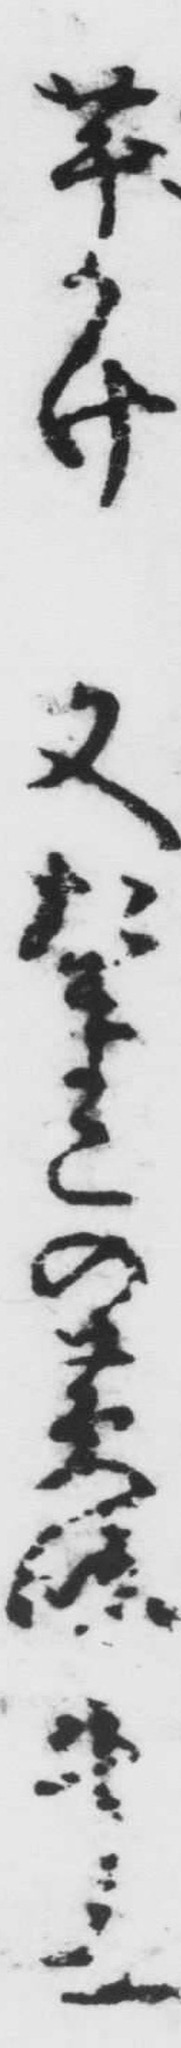芋かけ又たまこの黄味
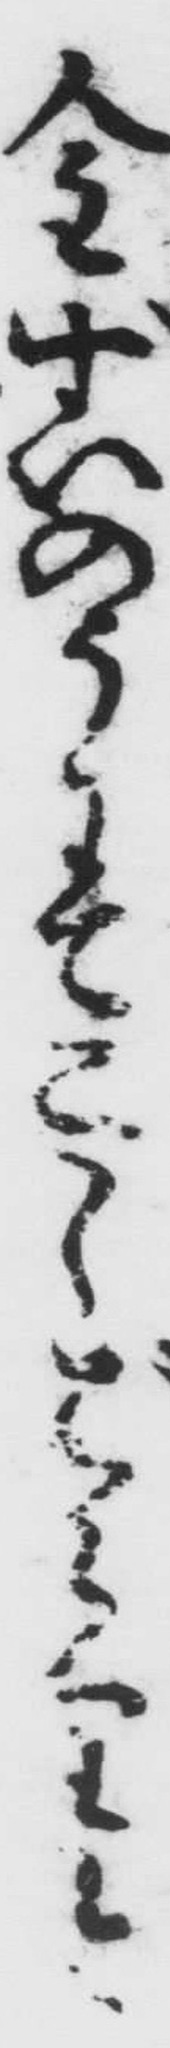金ずいのうにてこしどろりと
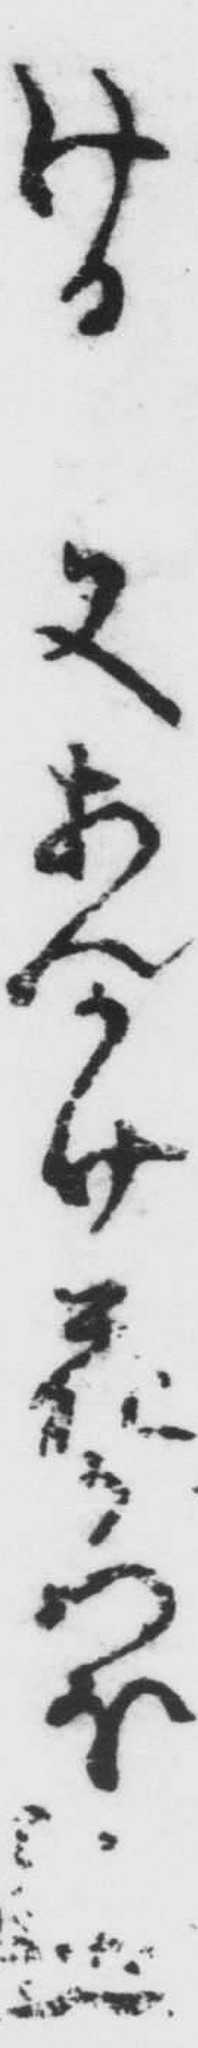ける又あんかけ花がつほ
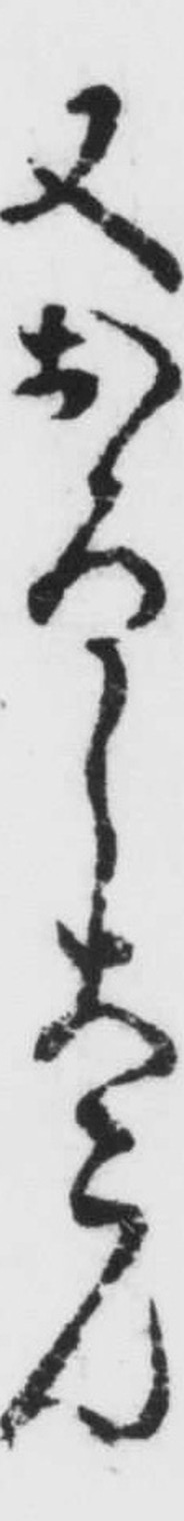又おろし大こん
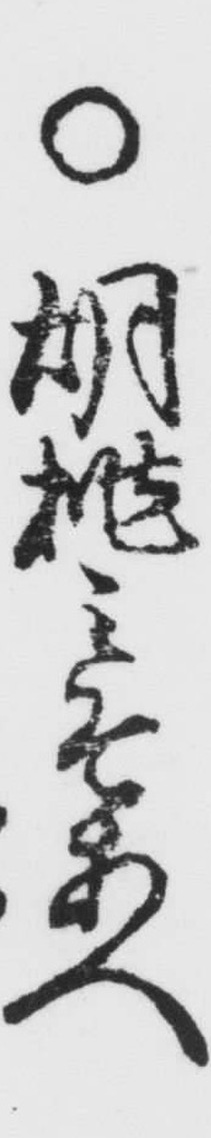○胡桃みそあへ
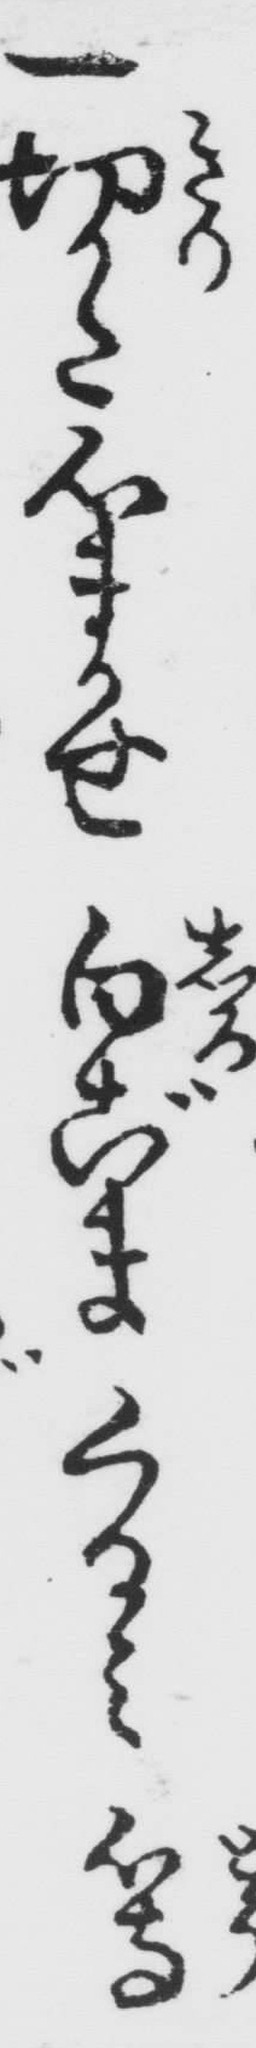一切かた心まかせ白ごまくるみ等
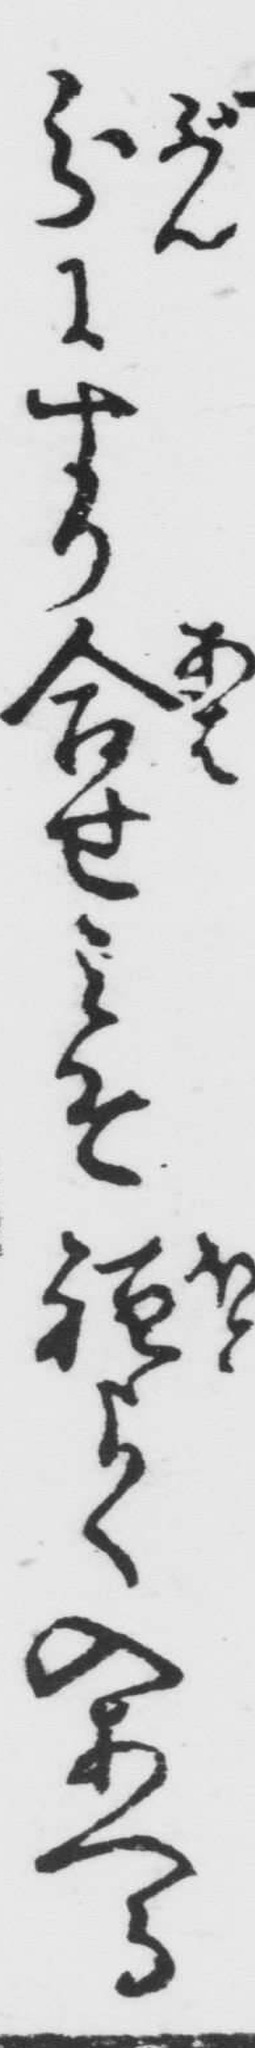分にすり合せみそ程よく入あへる
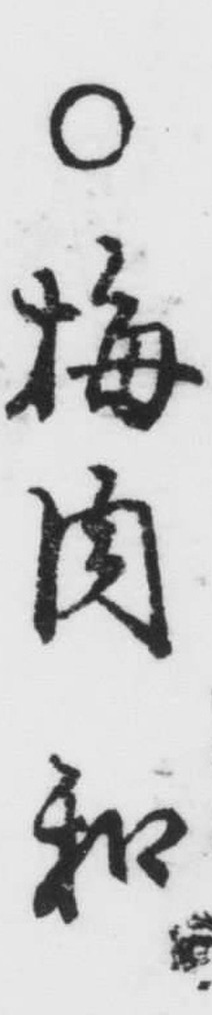○梅肉和
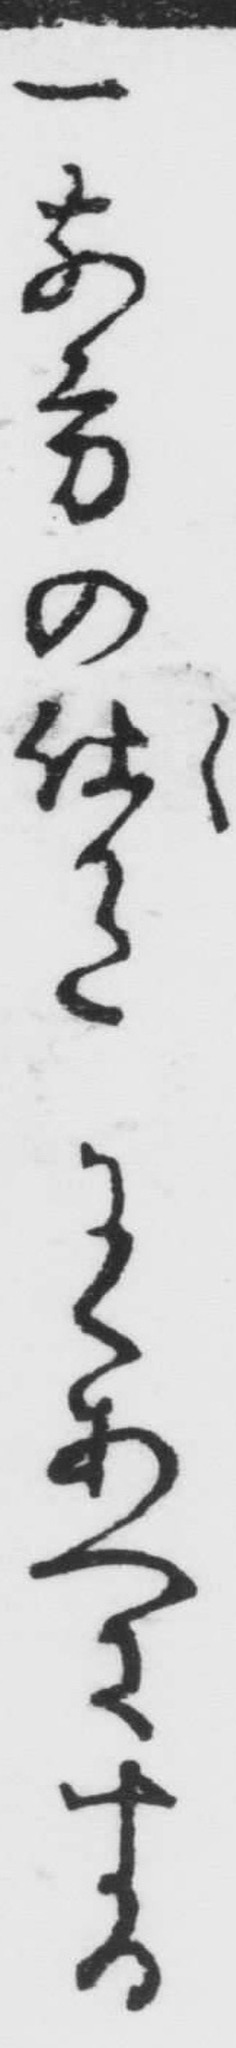一前方の仕かたにくあへにする

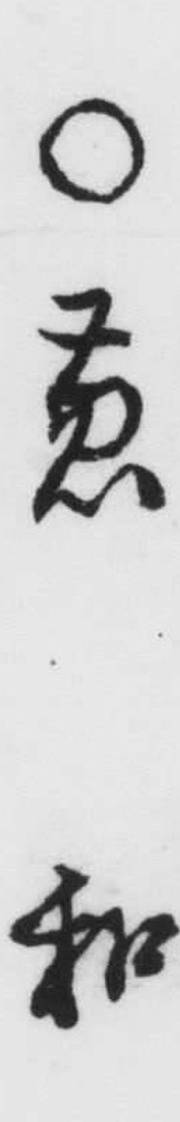○葱和
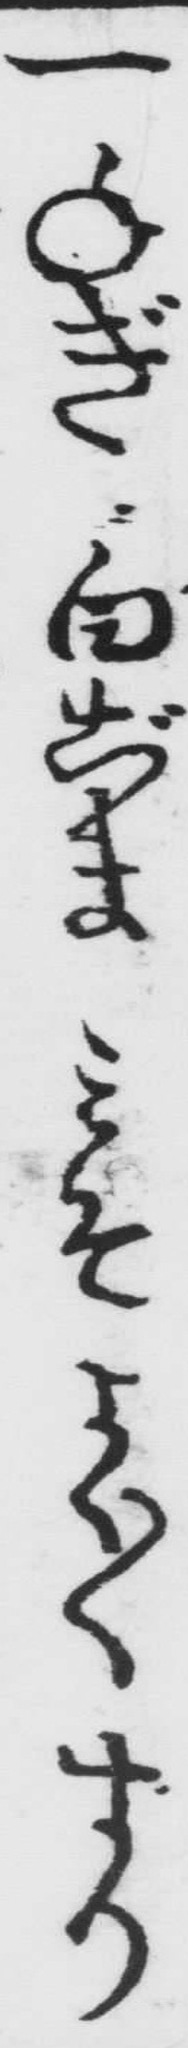一ねぎ白ごまみそよく〳〵すり
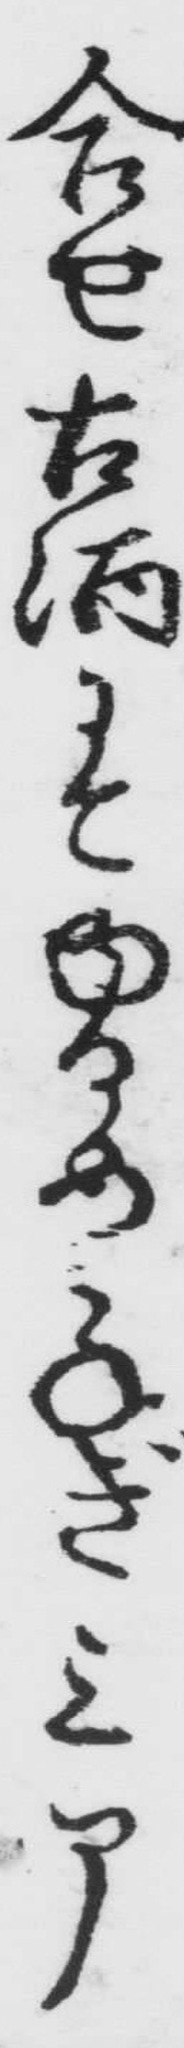合せ古酒にてゆるめねぎ三分
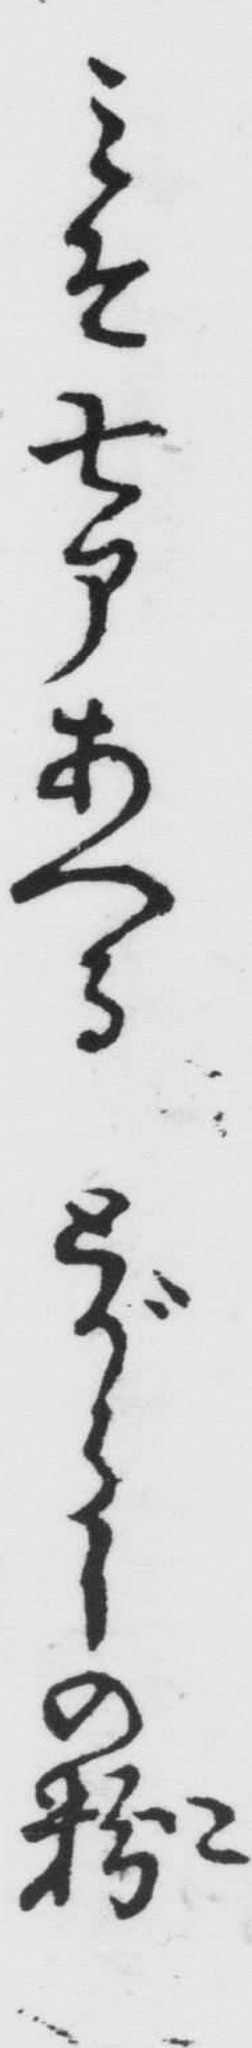みそ七分あへるとがらしの粉
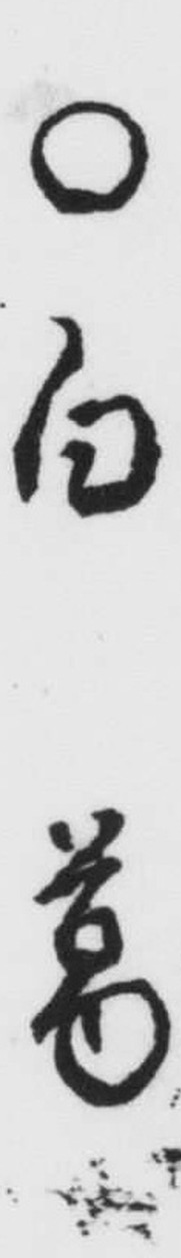○白葛
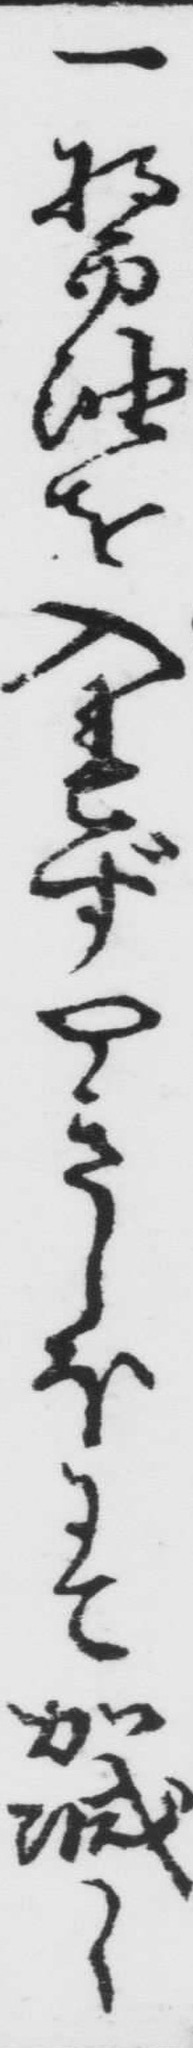一醤油を入れずやきしほにて加減し
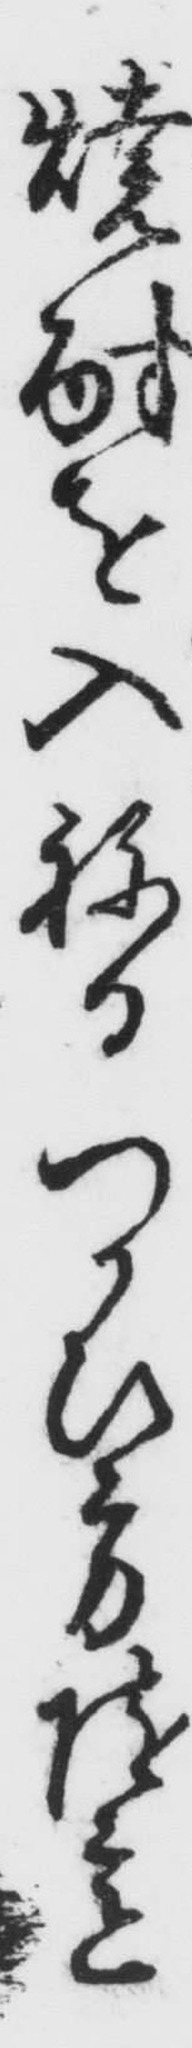焼酎を入ねるつかひ方随意
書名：蒟蒻百珍
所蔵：大阪府立大学学術情報センター 国文学研究資料館
